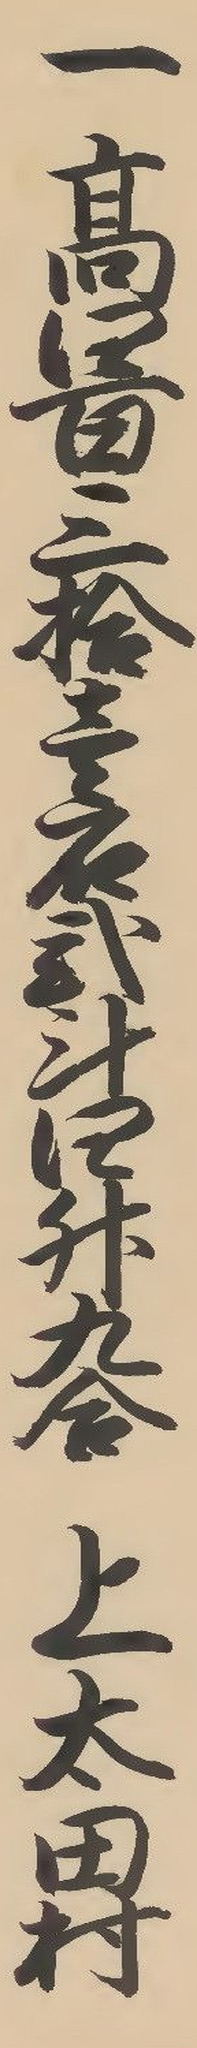一髙四百三拾壱石弐斗四升九合上太田村

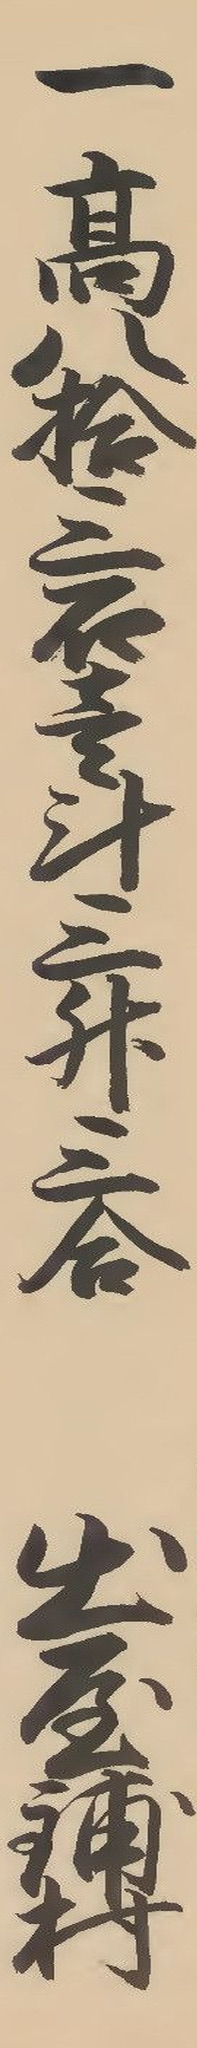一髙八拾三石壱斗三升三合出屋鋪村
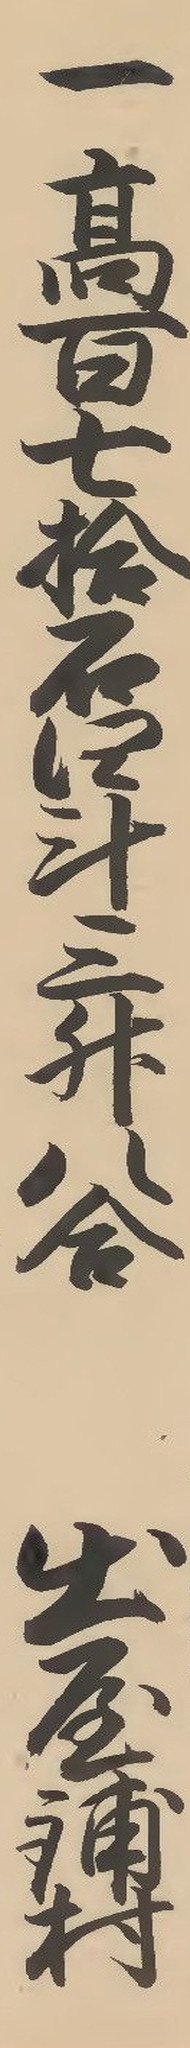一髙百七拾石四斗三升八合出屋鋪村
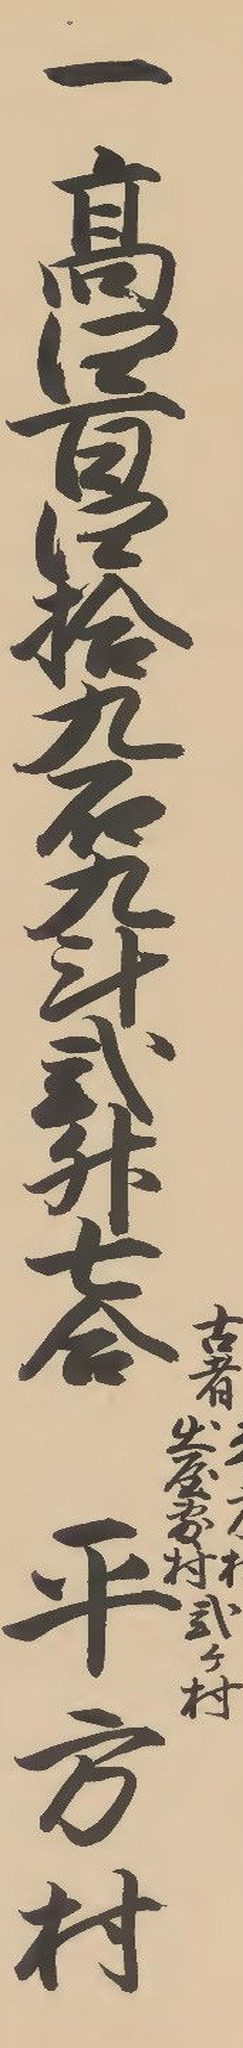一髙四百四拾九石九斗弐升七合平方村
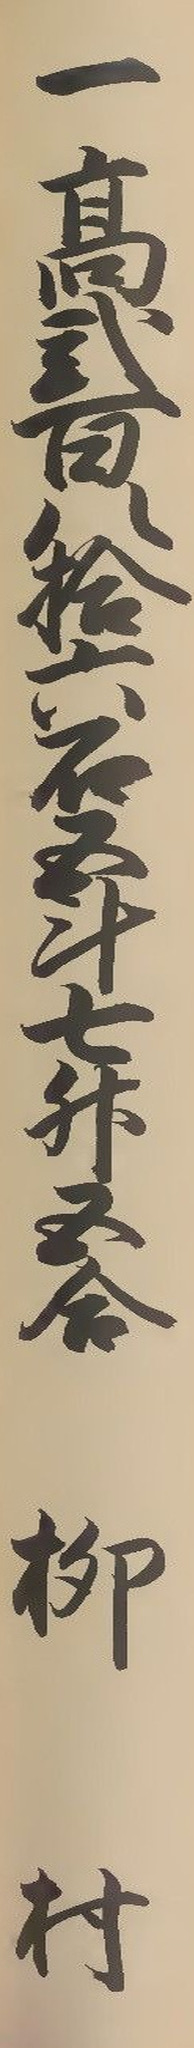一髙弐百八拾六石五斗七升五合柳村
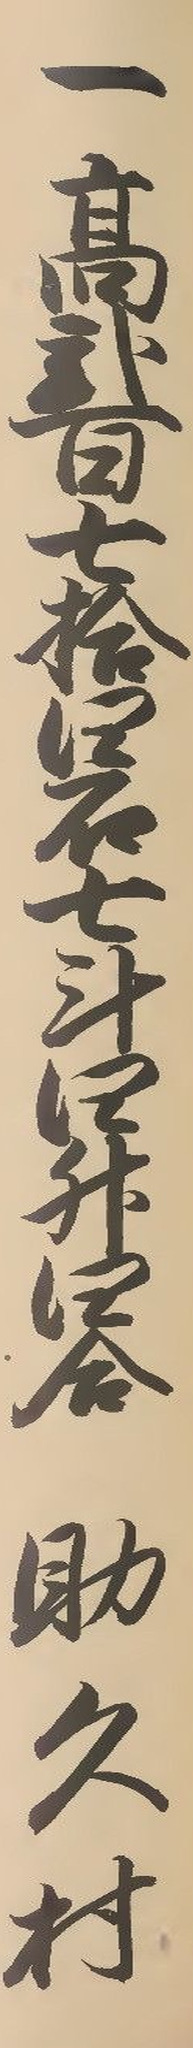一髙弐百七拾四石七斗四升四合助久村
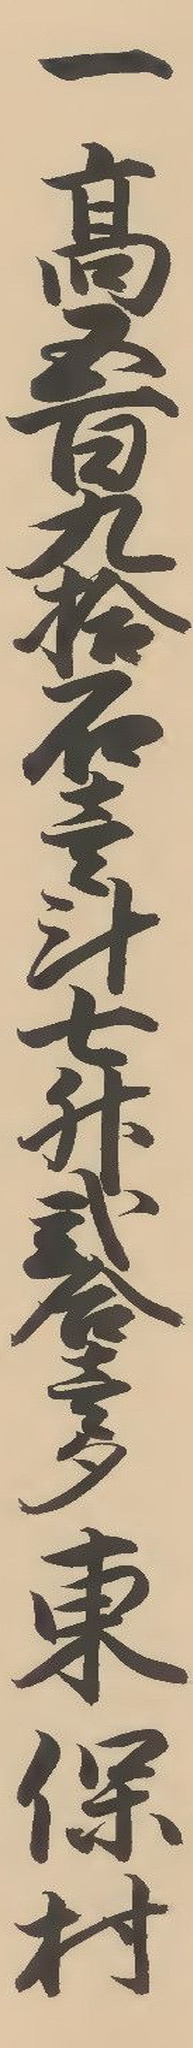一髙五百九拾石壱斗七升弐合壱夕東保村
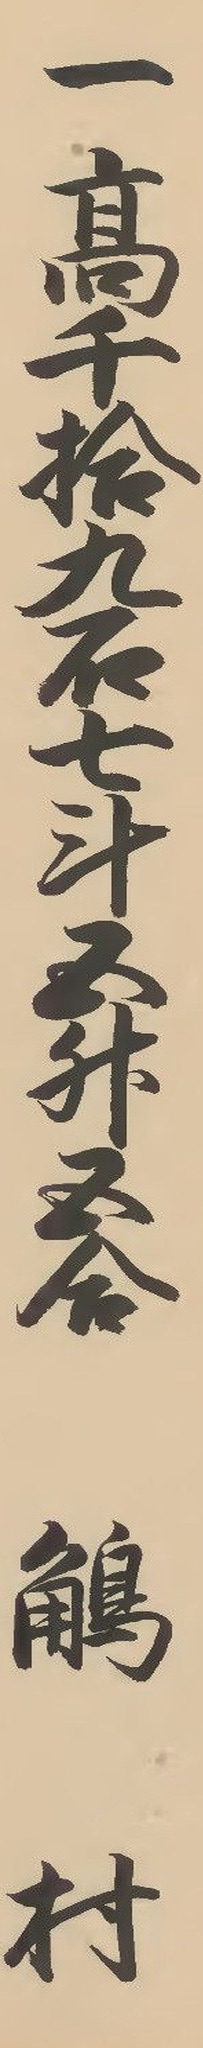一髙千拾九石七斗五升五合鵤村
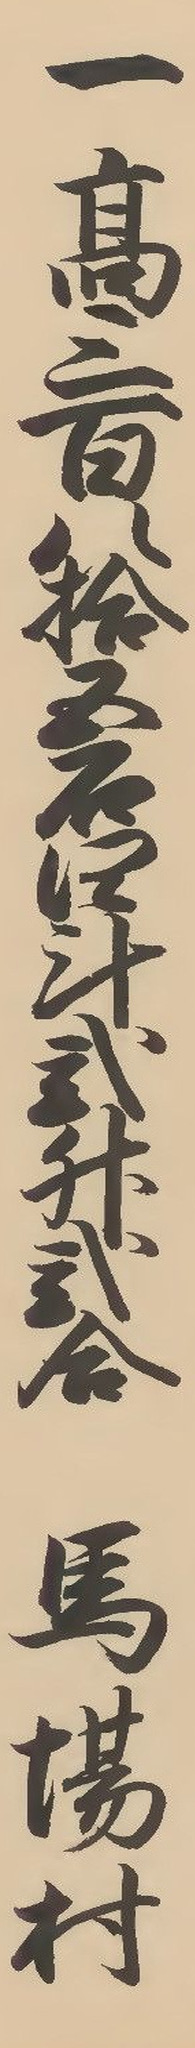一髙三百八拾五石四斗弐升弐合馬場村

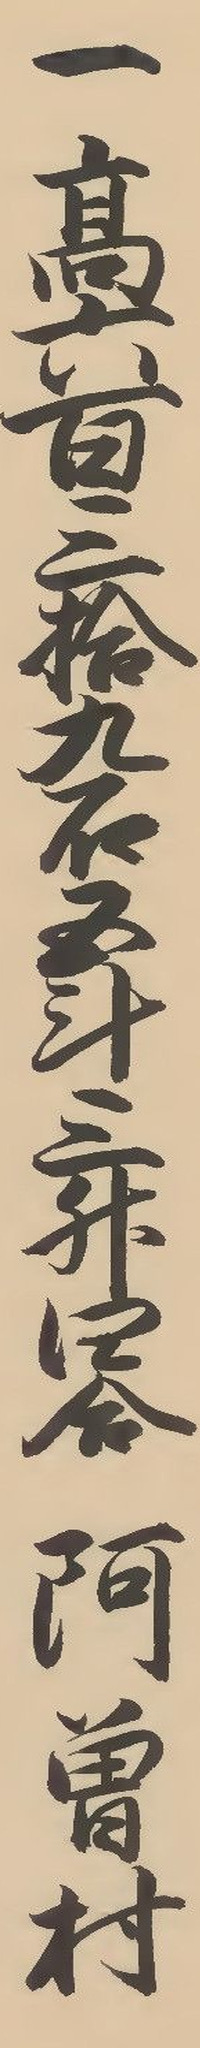一髙六百三拾九石五斗三升四合阿曽村
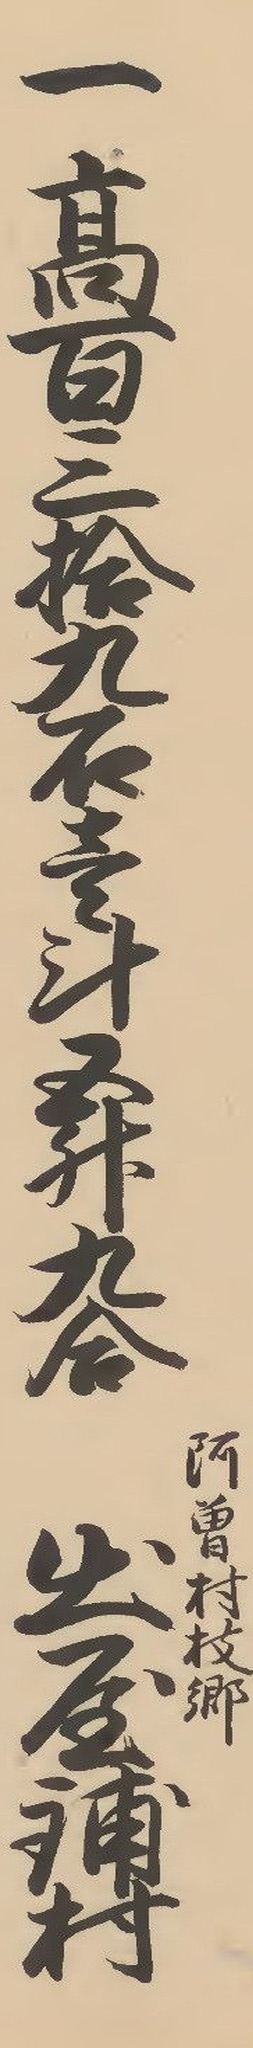一髙百三拾九石壱斗五升九合出屋鋪村
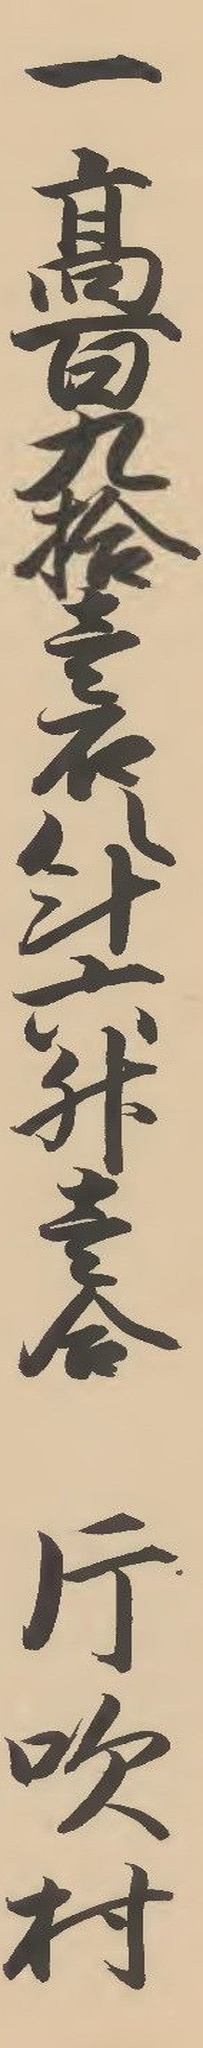一髙百九拾壱石八斗六升壱合片吹村
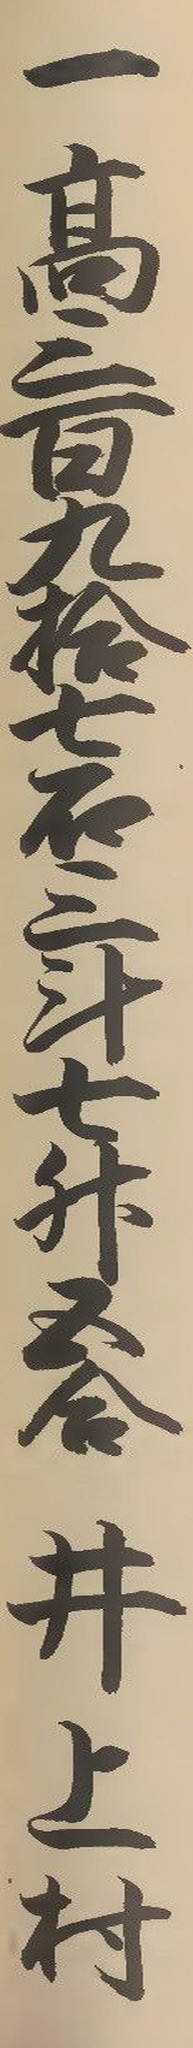一髙三百九拾七石三斗七升五合井上村
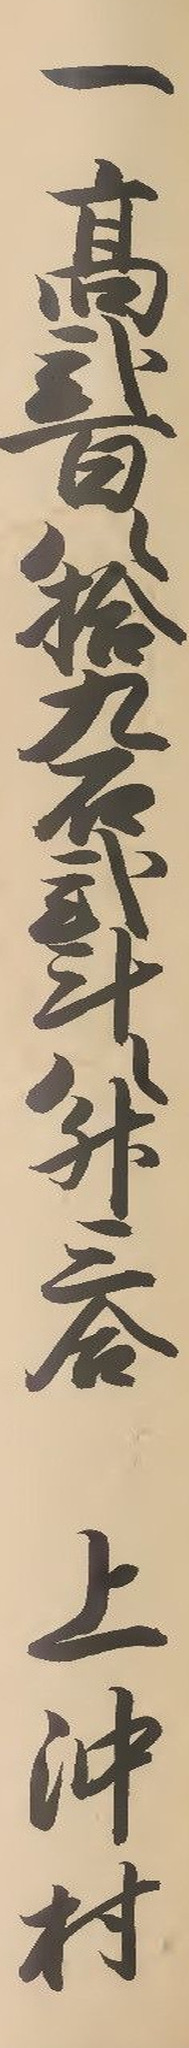一髙弐百八拾九石弐斗八升三合上沖村
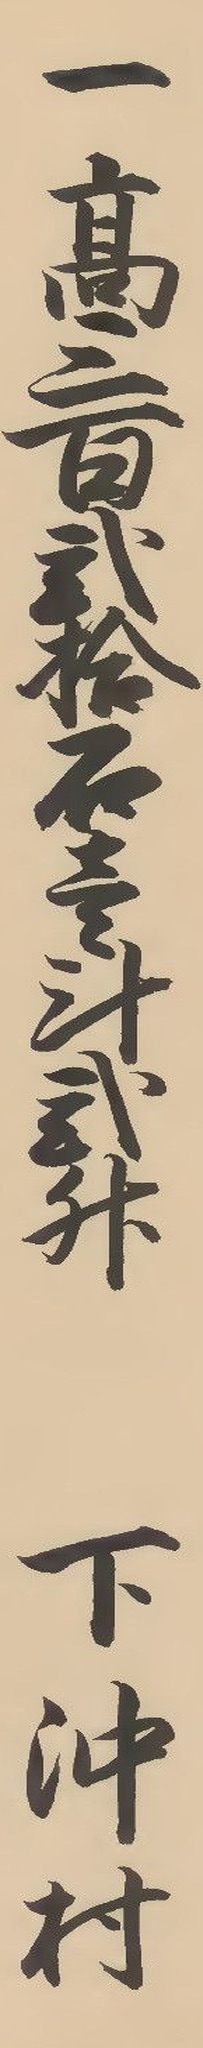一髙三百弐拾石壱斗弐升下沖村
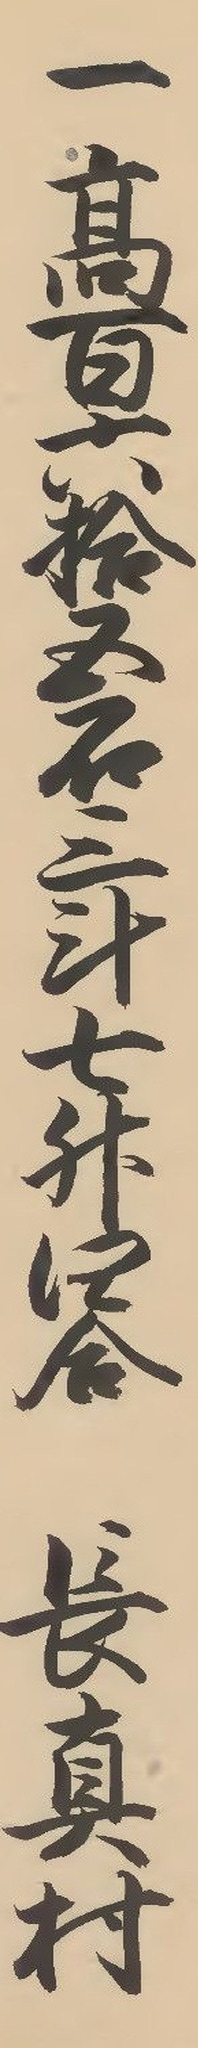一髙百六拾五石三斗七升四合長真村
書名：播磨国郷帳
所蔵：国立公文書館 National Archives of Japan
